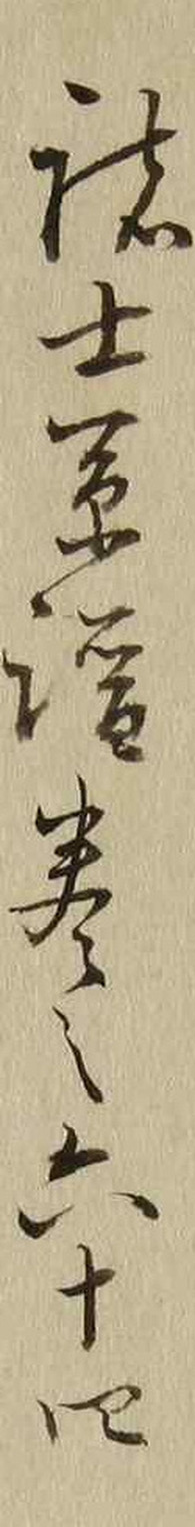諸士系譜巻之六十四
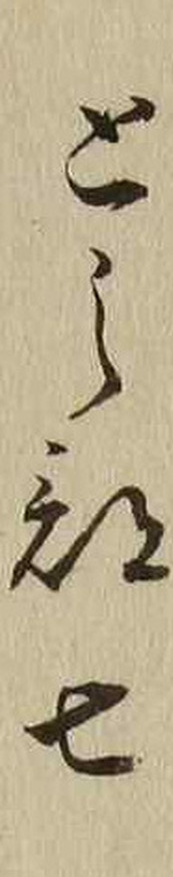と之部七
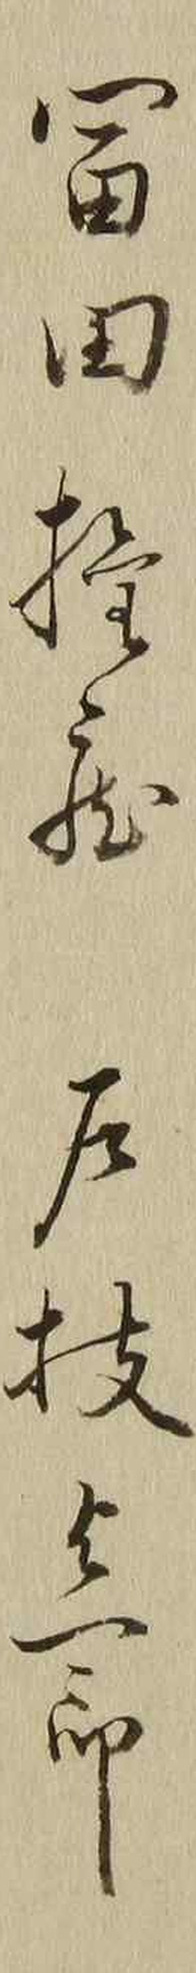冨田権蔵戸枝与一郎
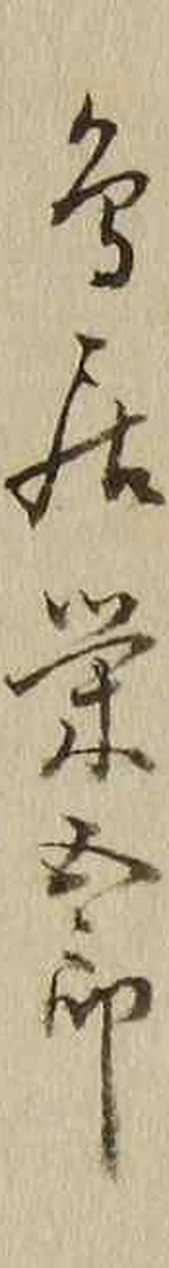鳥居栄五郎

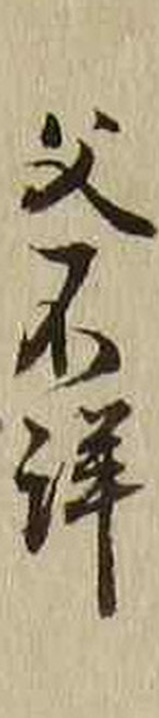父不詳
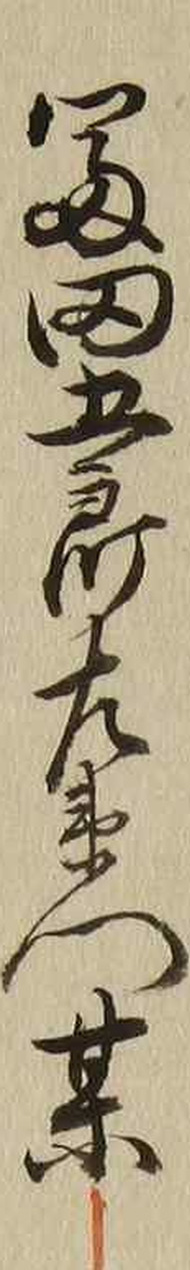冨田五郎左衛門某
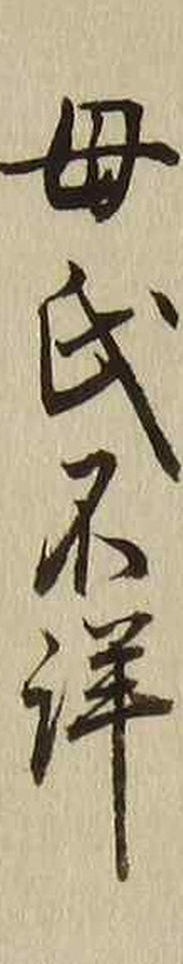母氏不詳
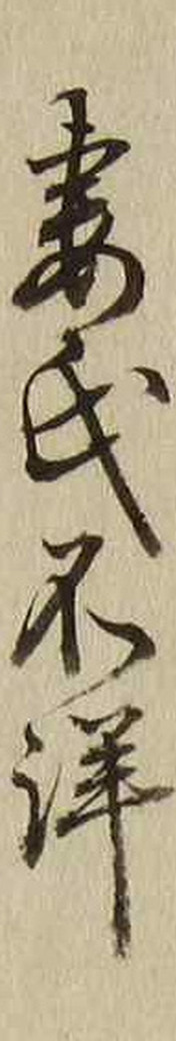母氏不詳
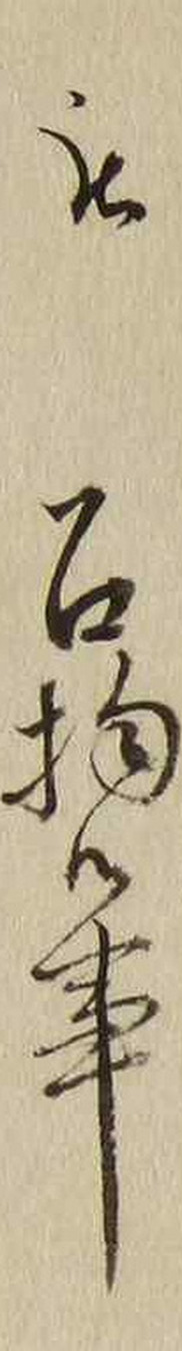被召拘候事

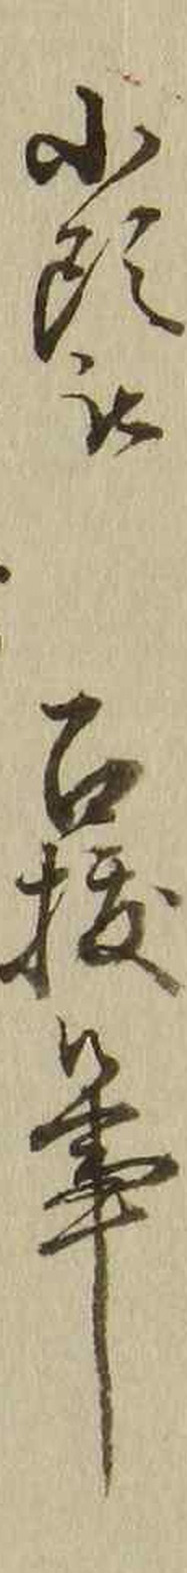小頭被召抜候事
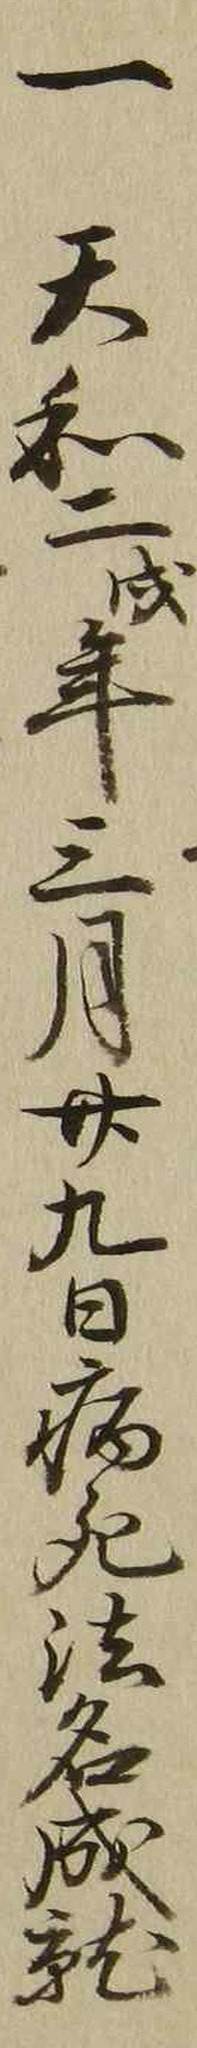一天和二戌年三月廿九日病死法名成就
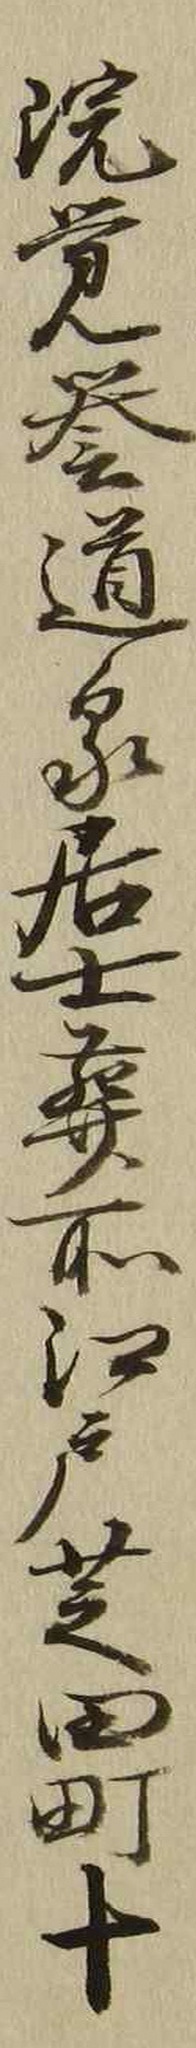院覚誉道泉居士葬所江戸芝田町十
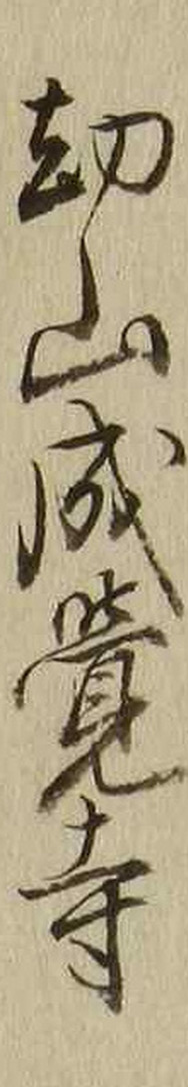却山成覚寺
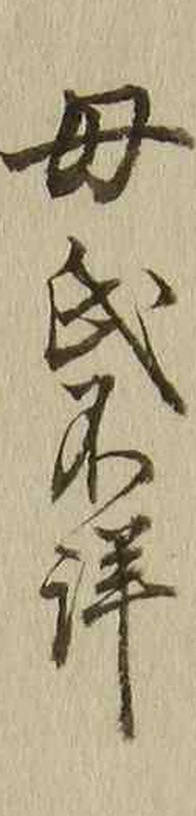母氏不詳
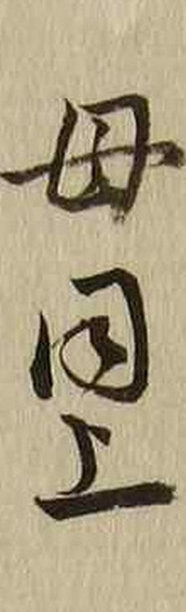母同上
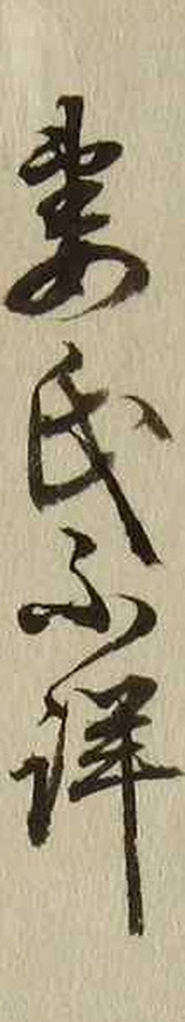母氏不詳
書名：諸士系譜　巻之64　と之部7
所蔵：会津若松市立会津図書館
